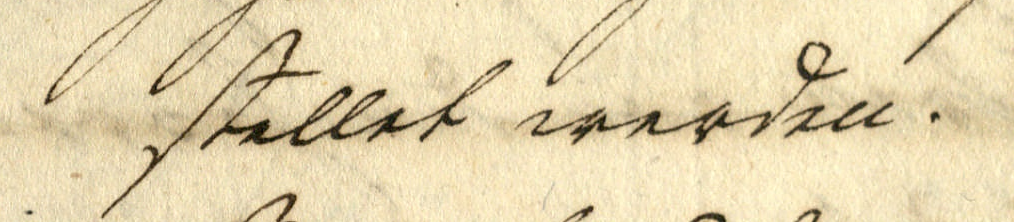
stellet werden.
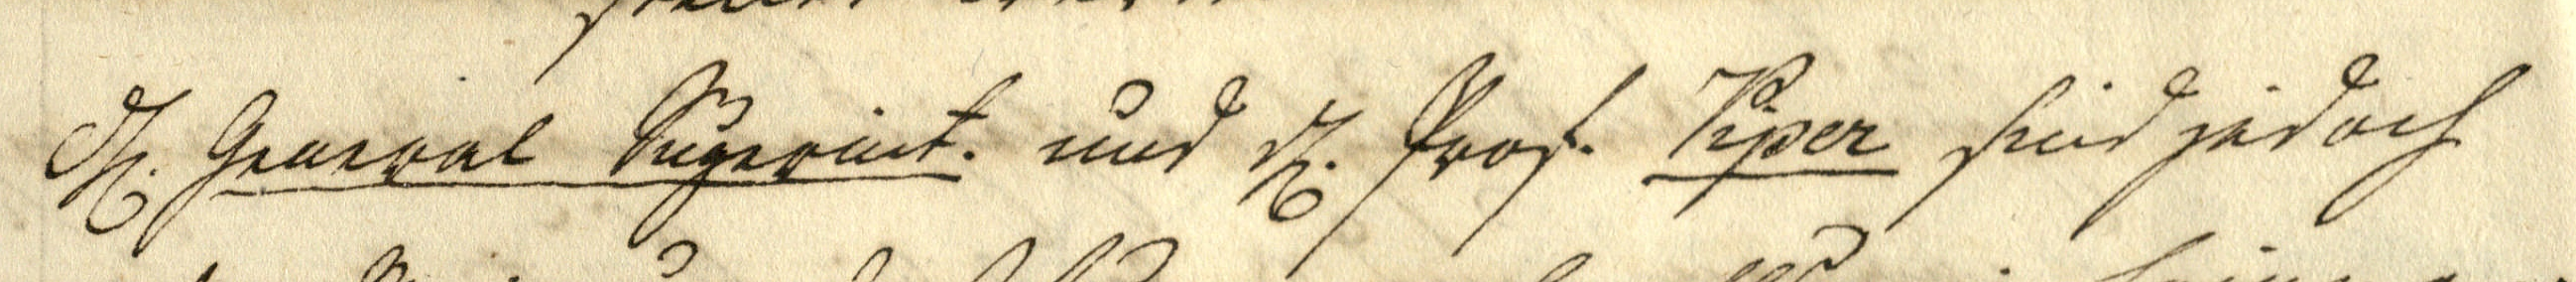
dh. General Superint. und dh. Porf. Piper sind jedoch
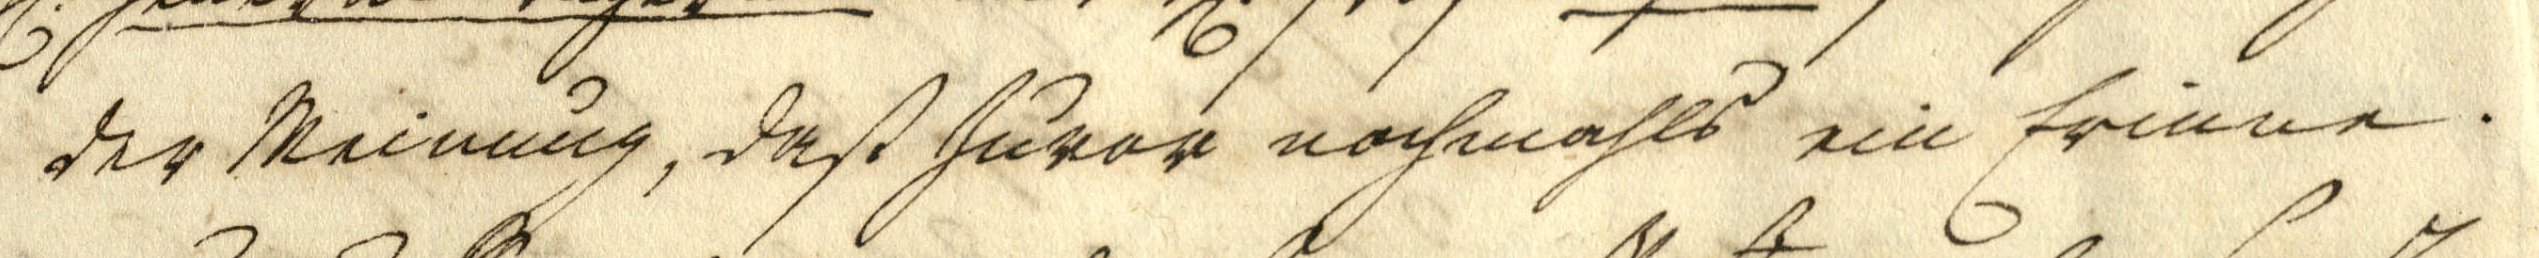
der Meinung, daß zuvor nochmahls ein Erinne-
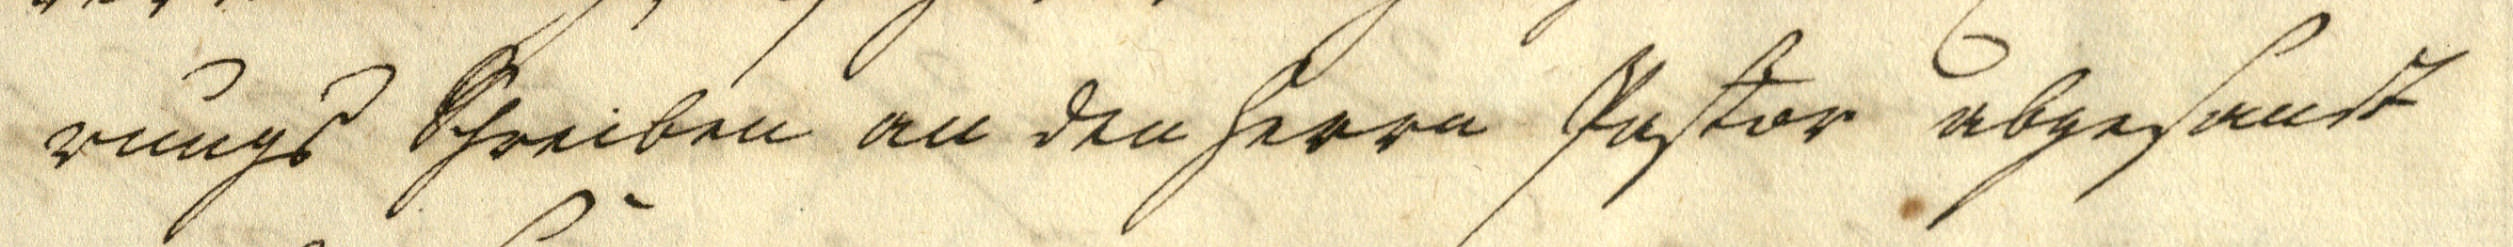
rungs Schreiben an den herrn Pastor abgesandt
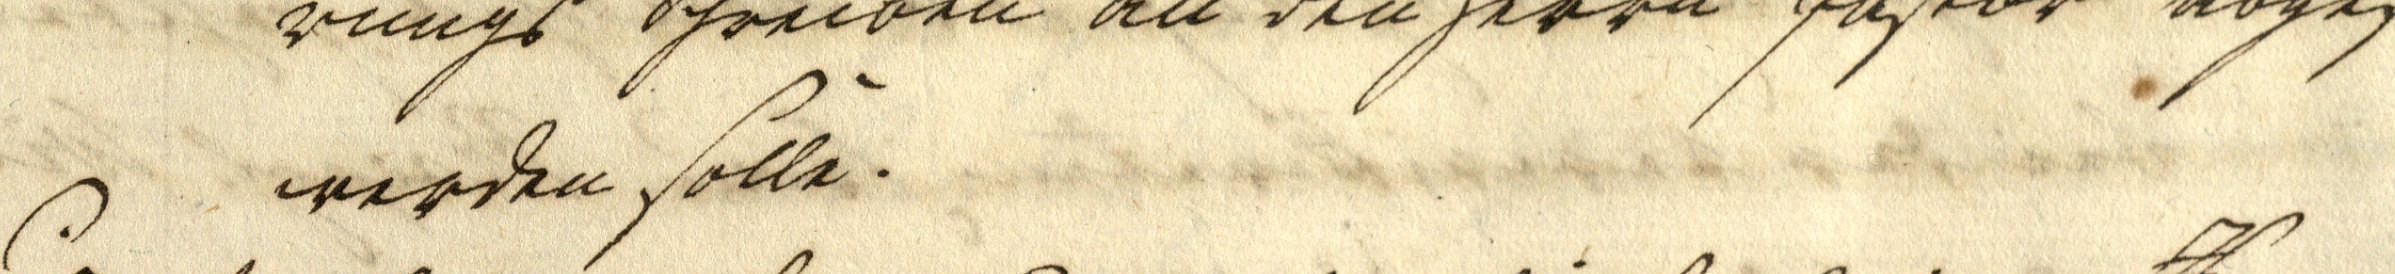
werden solle.
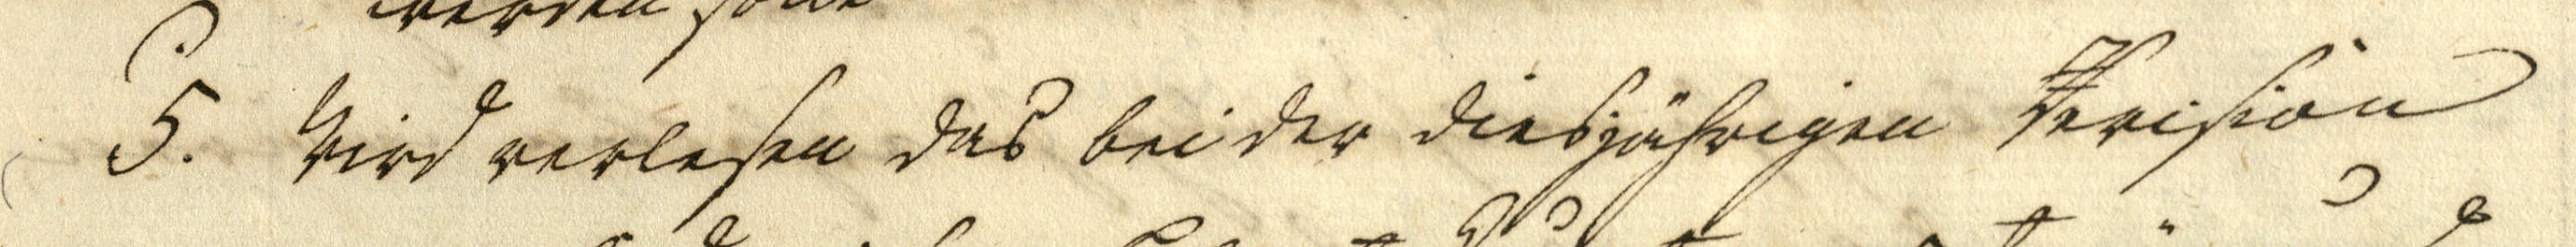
5., Wird verlesen das bei der diesjährigen Revision
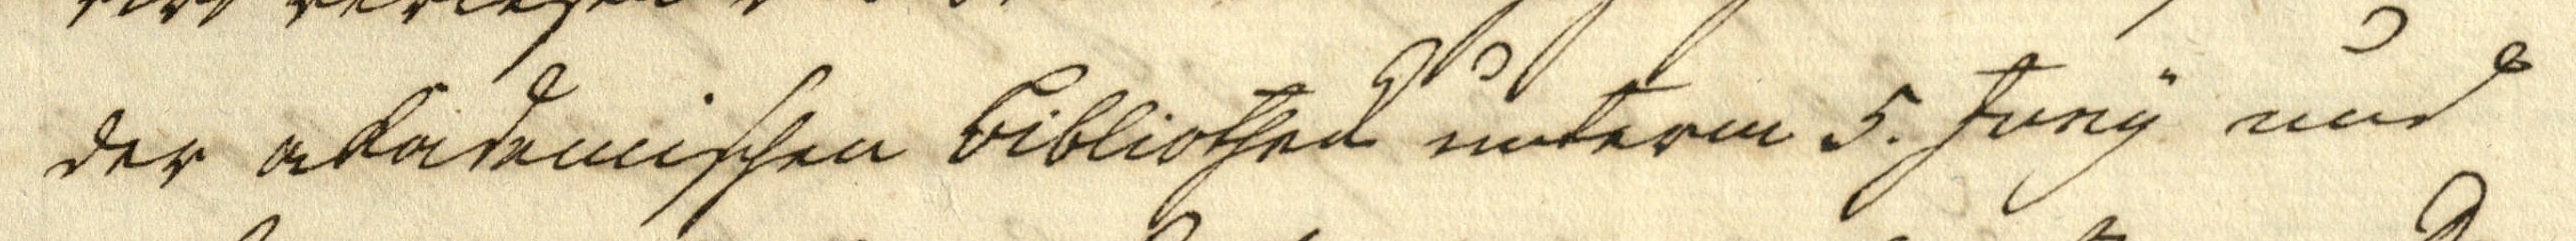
der akademsichen Bibliothek unterm 5. Juny und
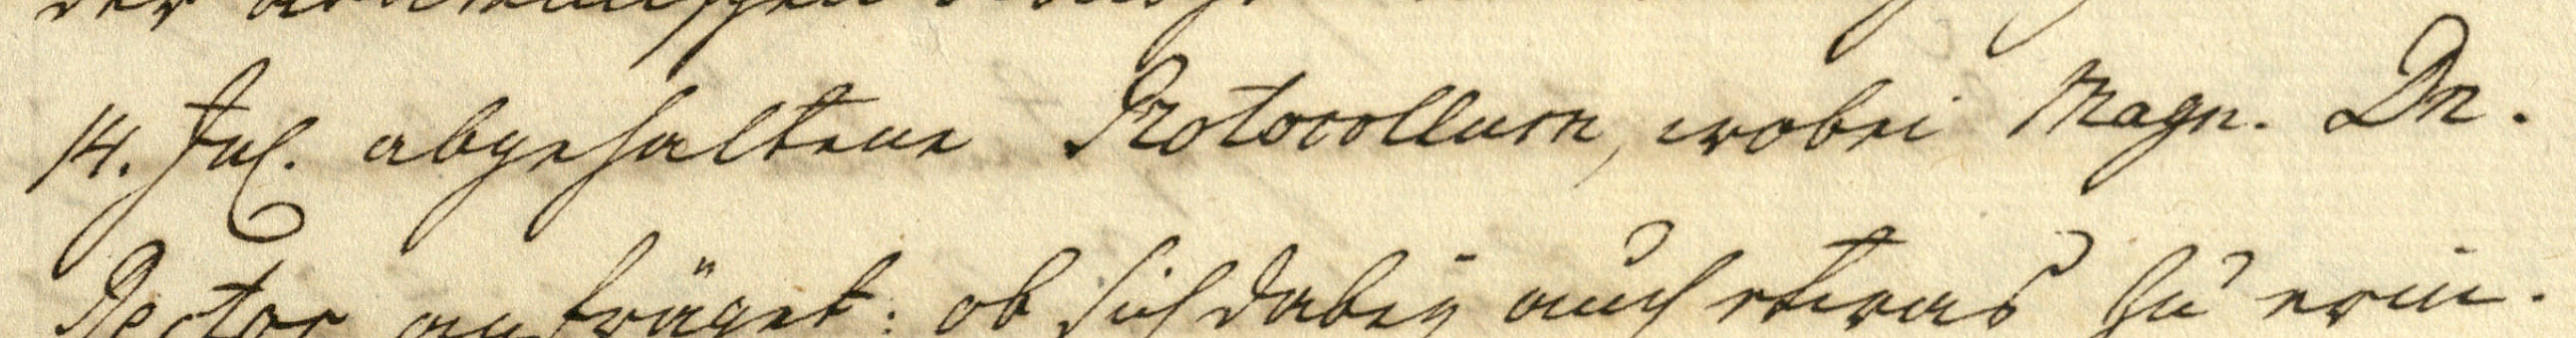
14. Jul. abgehaltene Protocollum, wobei Magn. Dn.
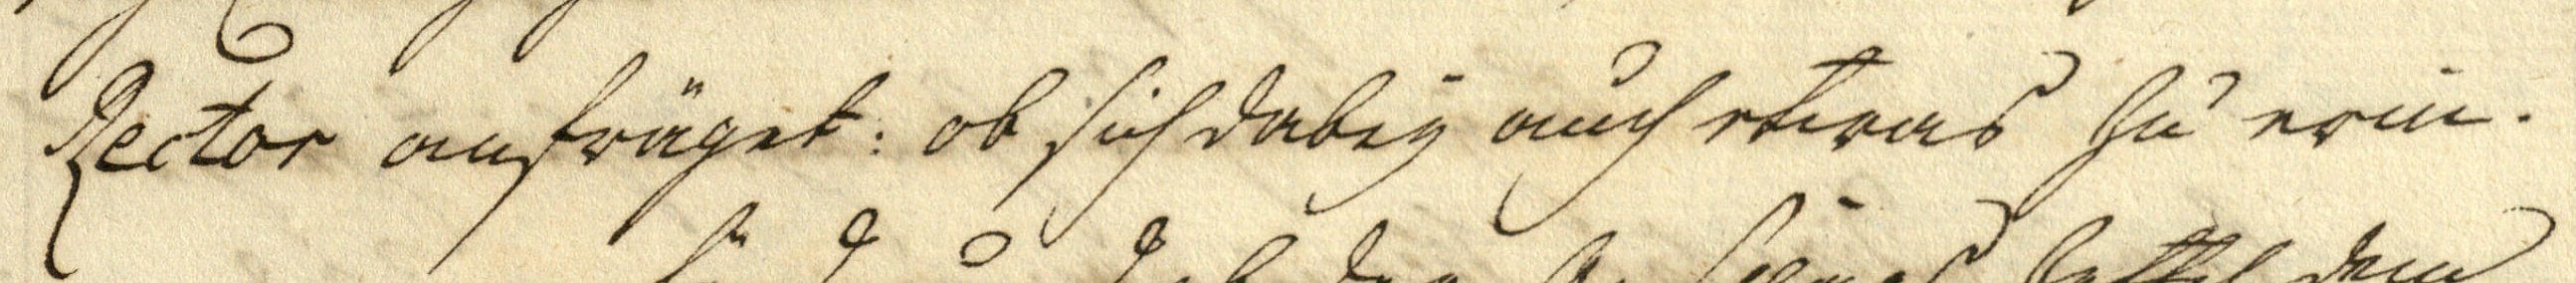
Rector anfräget: ob sich dabey auch etwas zu erin-
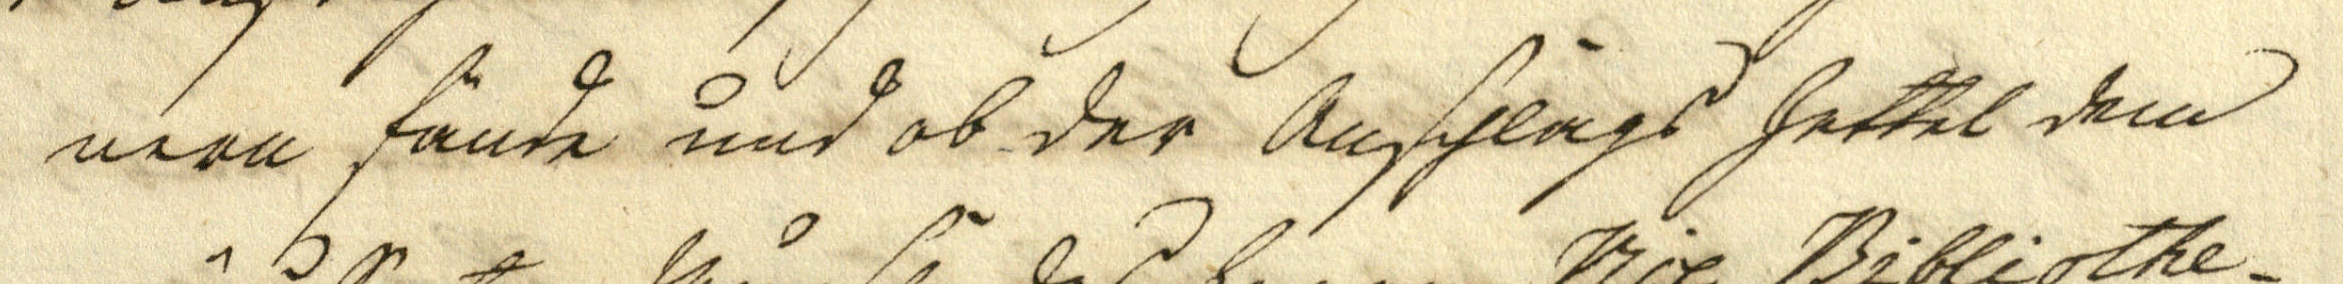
nern fände und ob der Anschlags Zettel dem
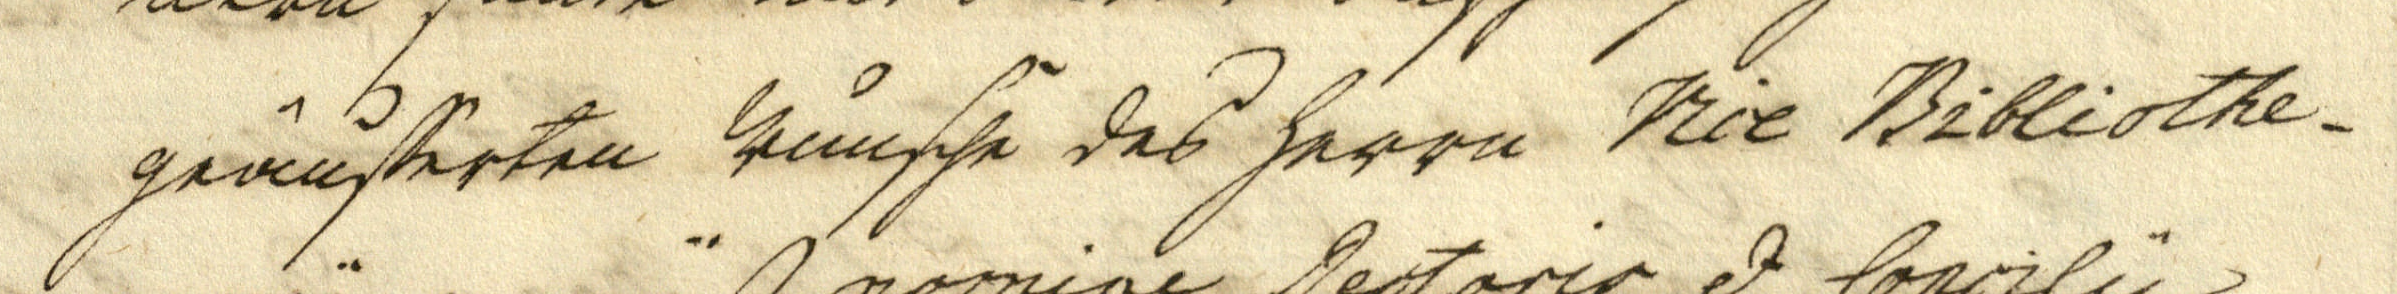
geäusserten Wunsche des Herrn vice Bibliothe-
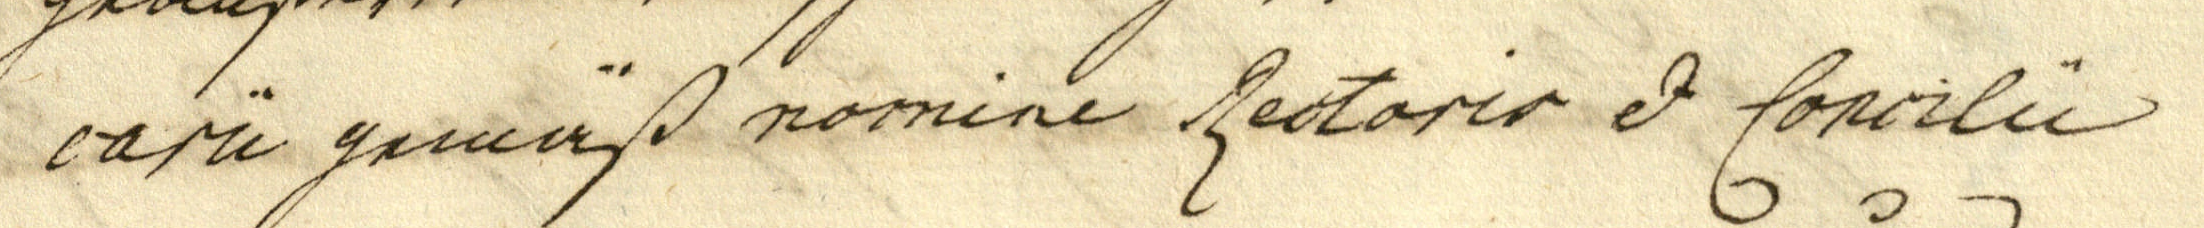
carii gemäß nomine Rectoris et Concilii
